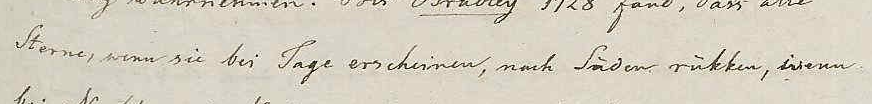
Sterne, wenn sie bei Tage erscheinen, nach Süden rükken, wenn
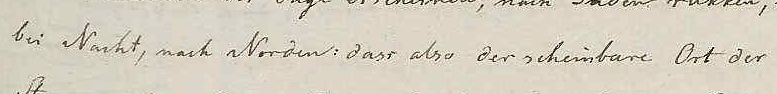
bei Nacht, nach Norden: dass also der scheinbare Ort der
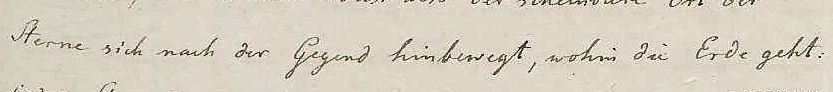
Sterne sich nach der Gegend hinbewegt, wohin die Erde geht:
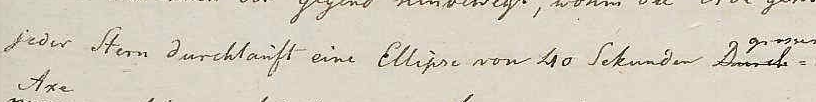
jeder Stern durchläuft eine Ellipse von 40 Sekunden Durch-
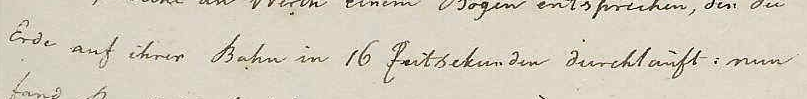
Erde auf ihrer Bahn in 16 Zeitsekunden durchläuft: nun
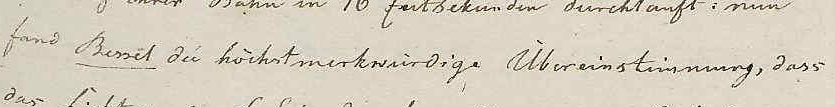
fand Bessel die höchstmerkwürdige Übereinstimmung, dass
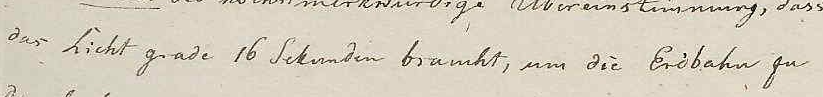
das Licht grade 16 Sekunden braucht, um die Erdbahn zu
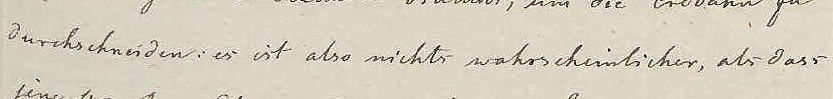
durchschneiden: es ist also nichts wahrscheinlicher, als dass
